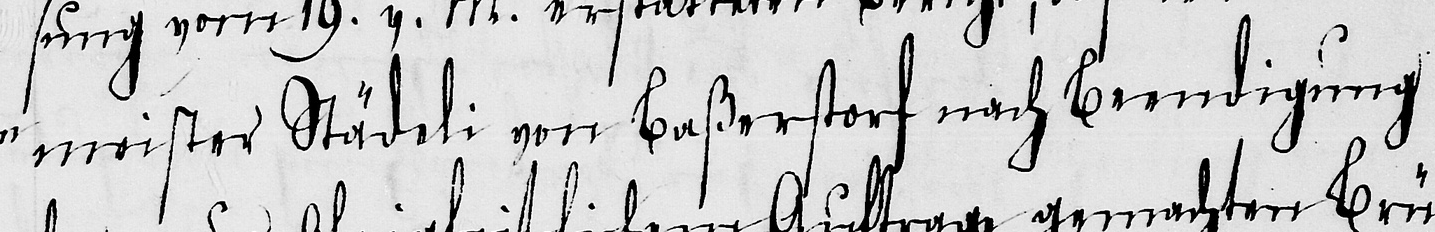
meister Städeli von Baßerstorf nach Beendigung
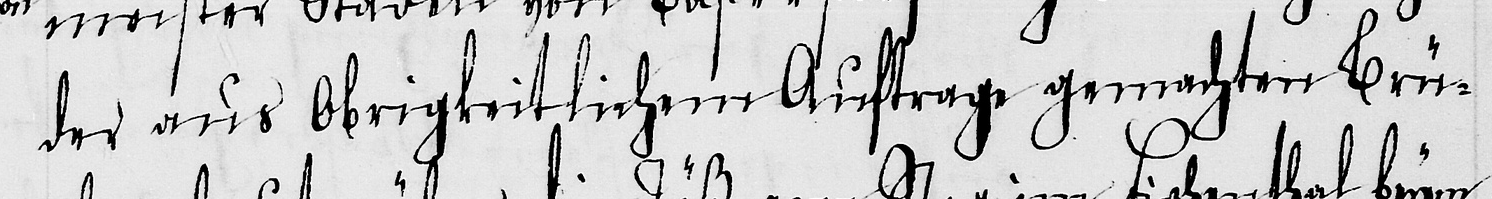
der aus Obrigkeitlichem Auftrage gemachten Brü¬
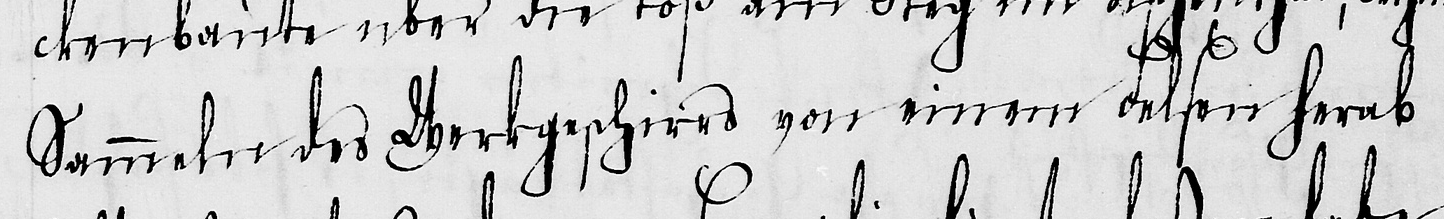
Sammeln des Werkgeschirrs von einem Felsen herab
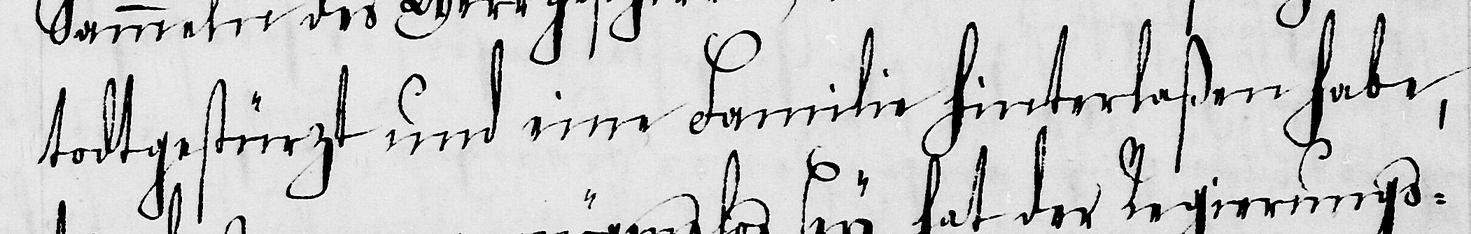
todtgestürzt und eine Familie hinterlaßen habe,
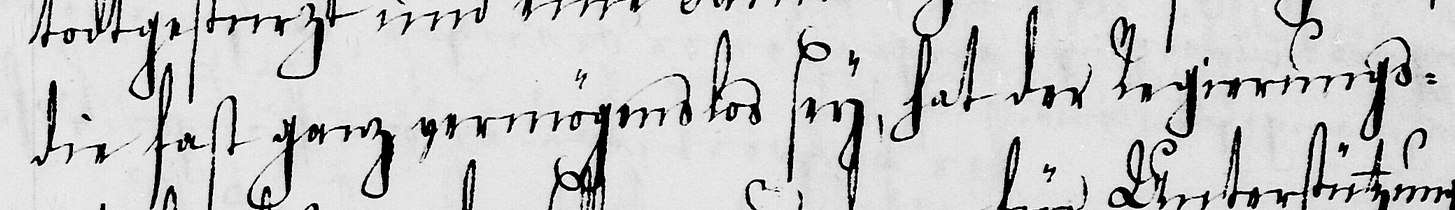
die fast ganz vermögenslos sey, hat der Regierungs¬
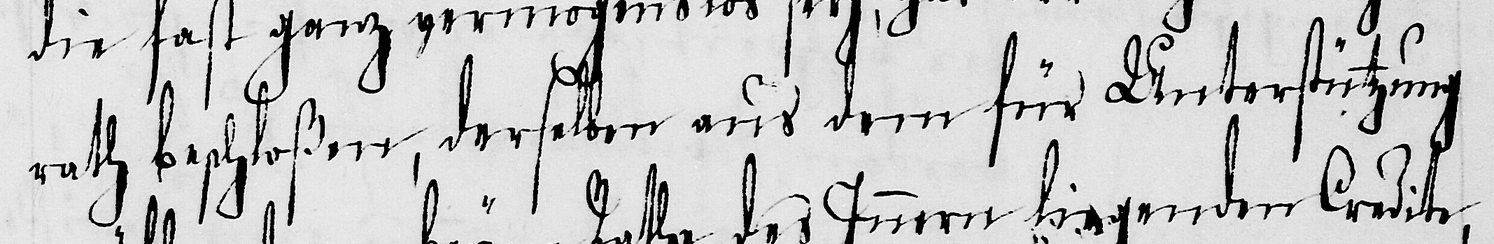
rath beschloßen, derselben aus dem für Unterstützung
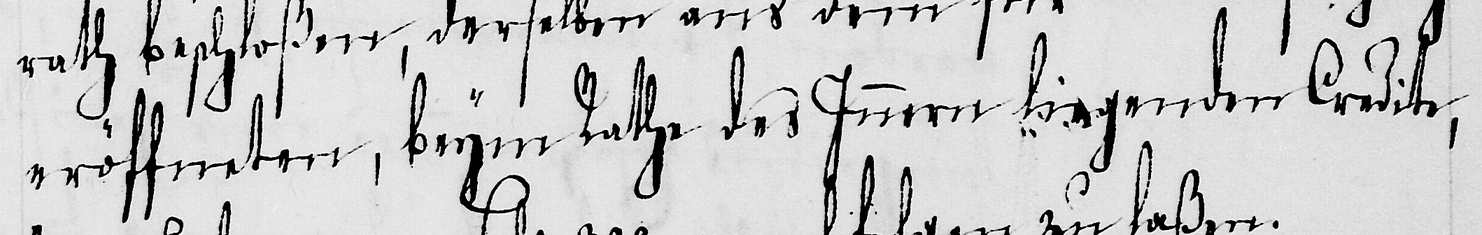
eröffneten, beym Rathe des Innern liegenden Credite,
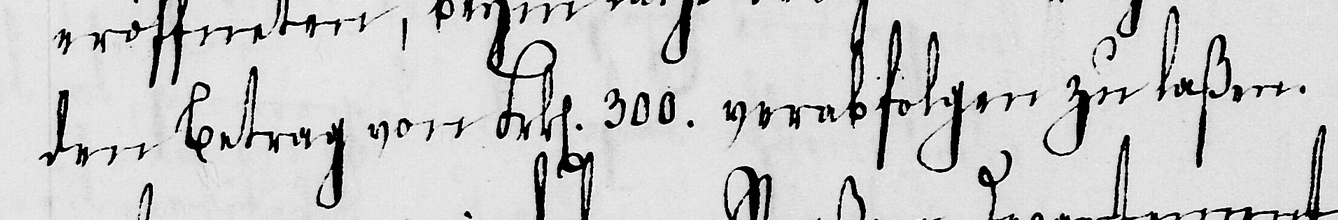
den Betrag von Frk[en]. 300. verabfolgen zu laßen.
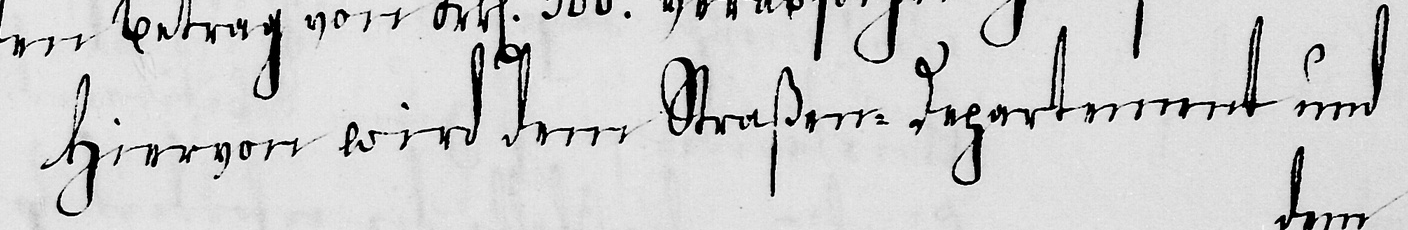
Hiervon wird dem Straßen-Departement und
